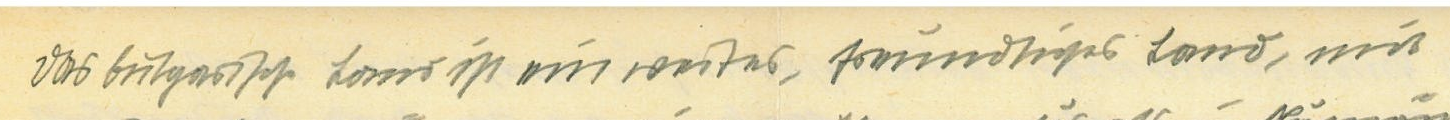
Das bulgarische Land ist ein weites, freundliches Land, mit
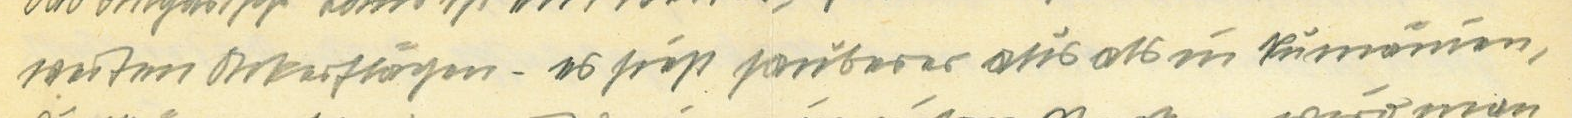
weiten Ackerflächen – es sieht sauberer aus als in Rumänien,
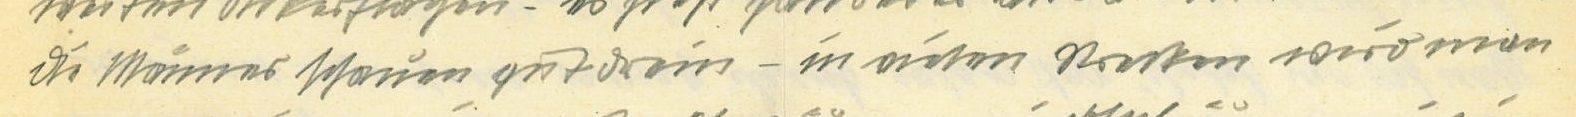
die Männer schauen gut drein – in vielen Strecken wird man
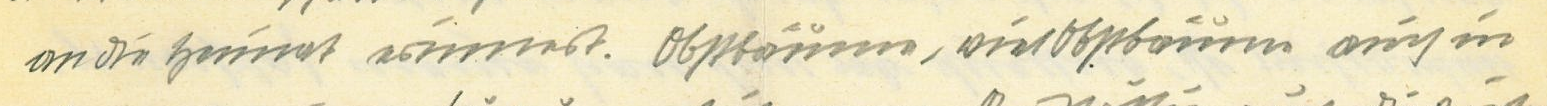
an die Heimat erinnert. Obstbäume, viel Obstbäume auch in
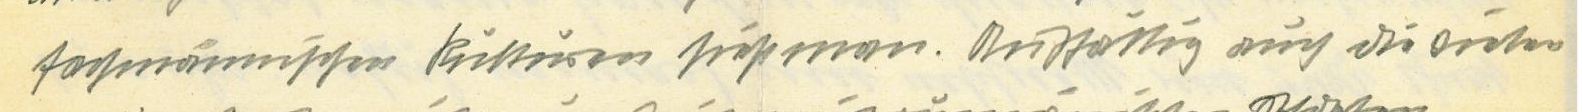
fachmännischen Kulturen sieht man. Auffällig auch die vielen
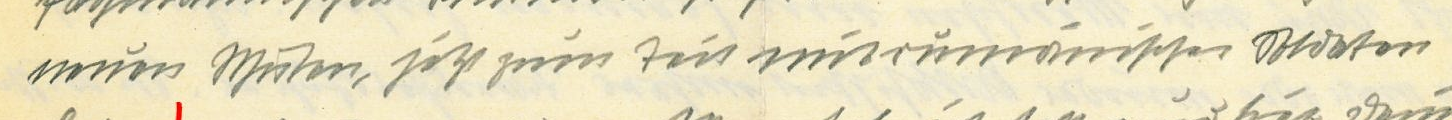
neuen Schulen, jetzt zum Teil mit rumänischen Soldaten
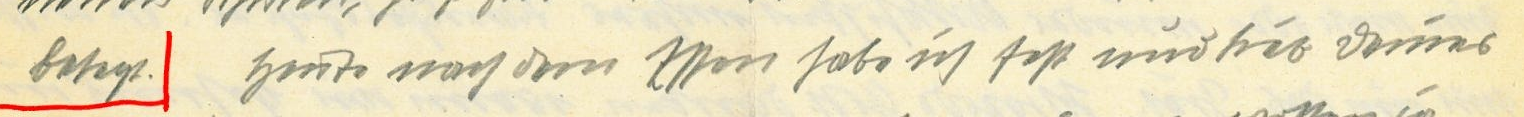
belegt. Heute nach dem Essen habe ich fest und lieb Deiner
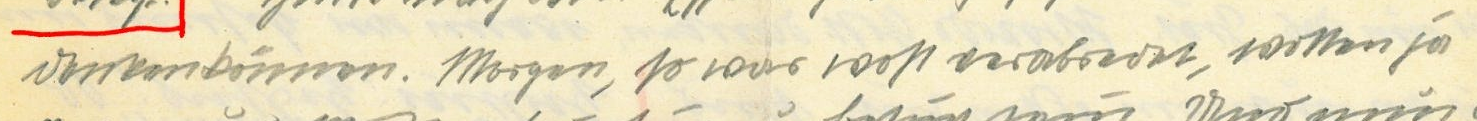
denken können. Morgen, so war wohl verabredet, wollen ja
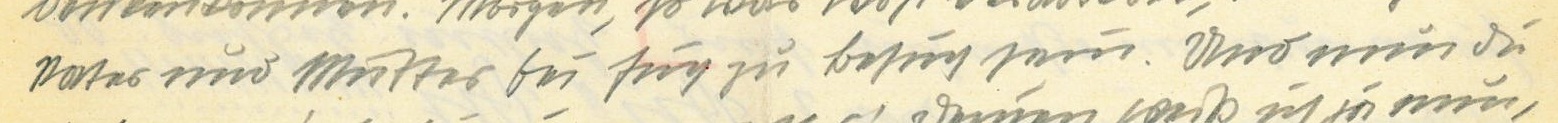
Vater und Mutter bei Euch zu Besuch sein. Und nun die
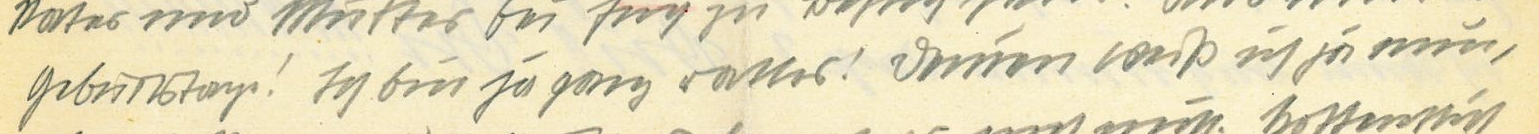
Geburtstage! Ich bin ja ganz ratlos! Deinen weiß ich ja nun,
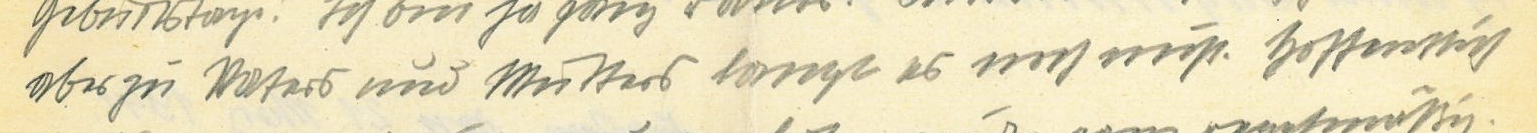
aber zu Vaters und Mutters langt es noch nicht. Hoffentlich
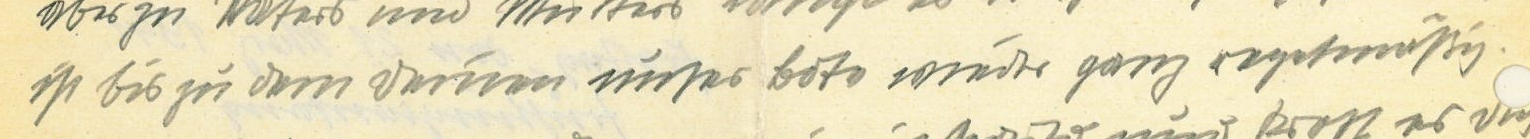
ist bis zu dem Deinen unser Bote wieder ganz regelmäßig.
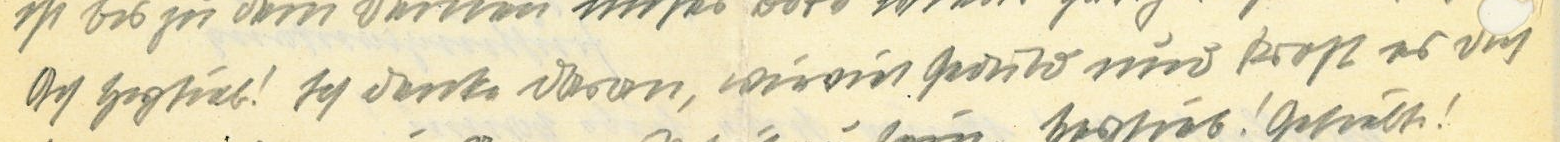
Ach Herzlieb! Ich denke daran, wieviel Geduld und Kraft es doch
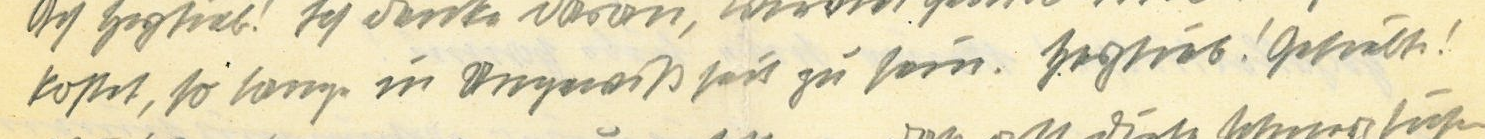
kostet, so lange in Ungewißheit zu sein. Herzlieb! Geliebte!
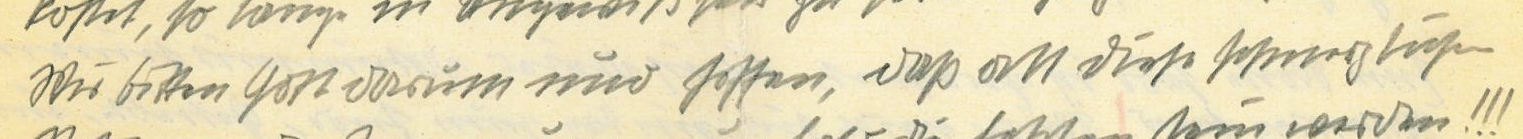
Wir bitten Gott darum und hoffen, daß all diese schmerzlichen
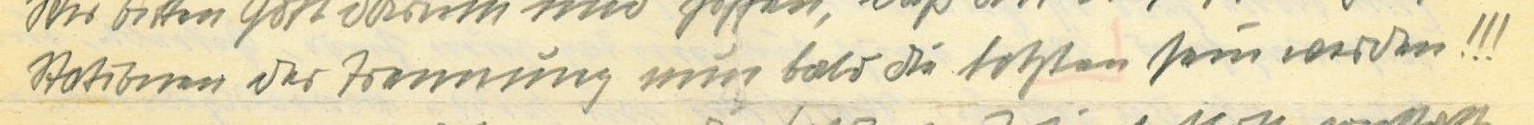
Stationen der Trennung nun bald die letzten sein werden!!!
